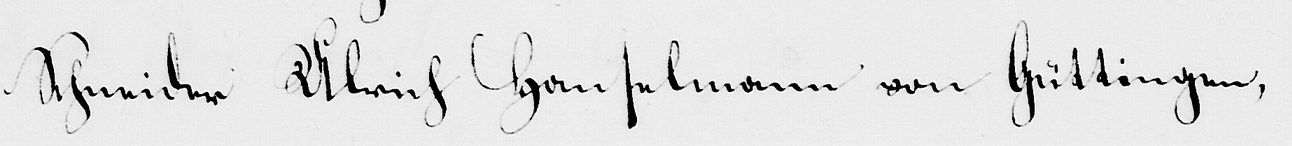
chneider Ulrich Hanselmann von Güttingen,
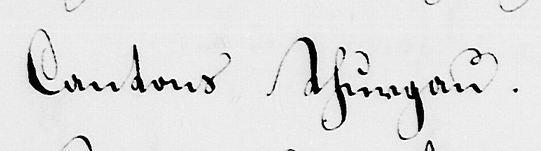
Cantons Thurgau.
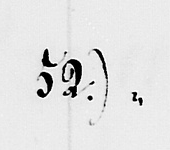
54.)
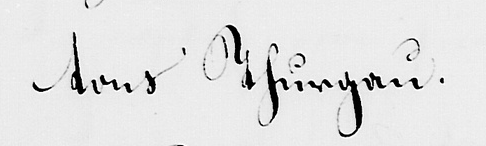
tons Thurgau.
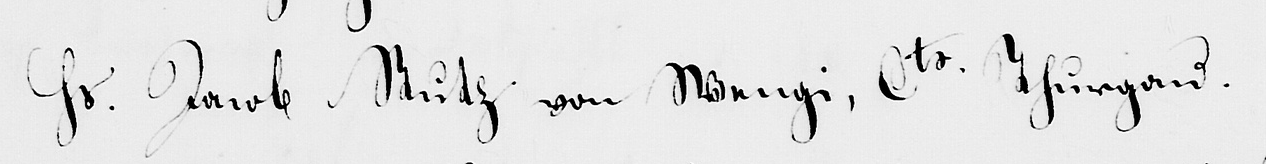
s. Jacob Stutz von Wengi, Cts. Thurgau.
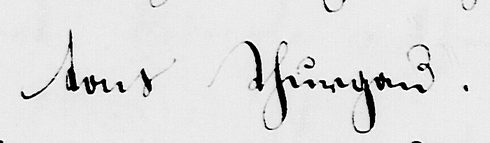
tons Thurgau.
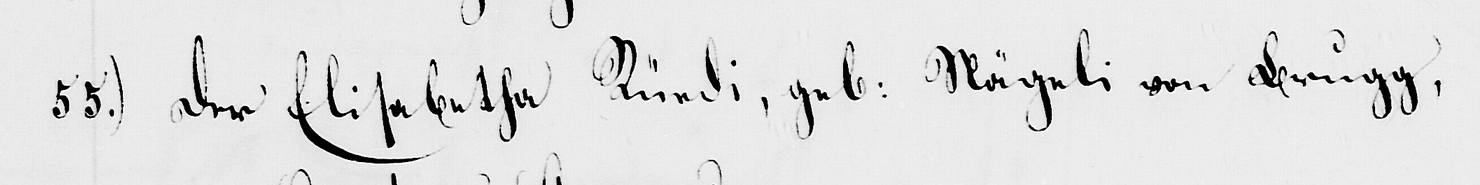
55.) der Elisabetha Rüedi, geb: Nägeli von Brugg,
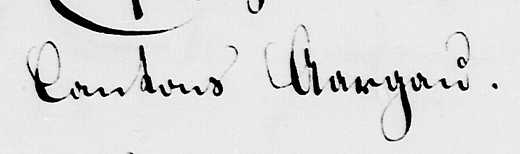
Cantons Aargau.
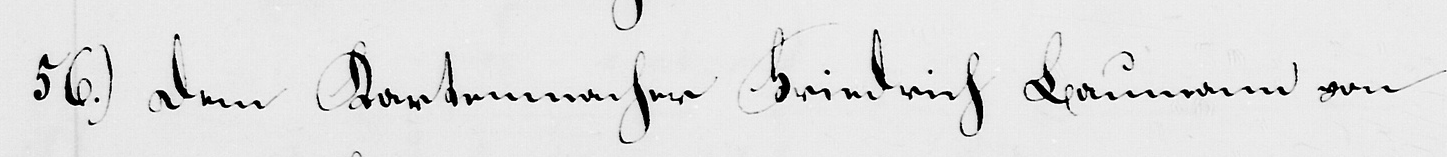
56.) dem Kartenmacher Friedrich Baumann von
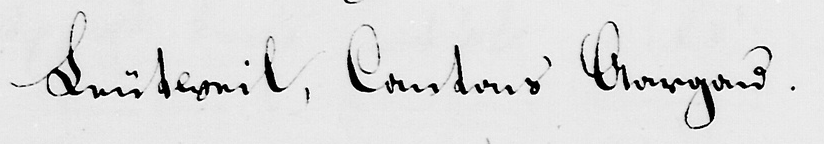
Leutweil, Cantons Aargau.
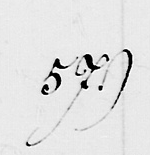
53.)
